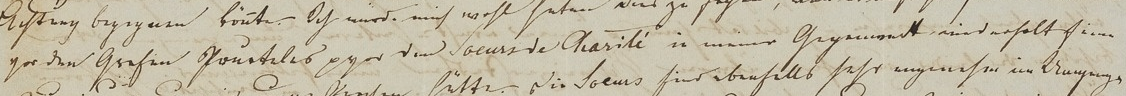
vor dem Grafen Pourtales & vor den Soeurs de Charité in meiner Gegenwart wiederholt seine
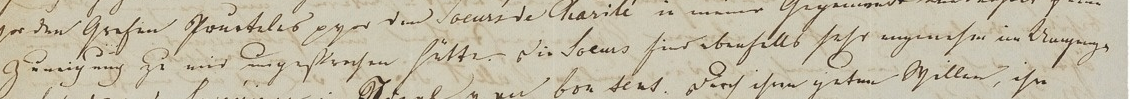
Zuneigung zu mir ausgesprochen hätte. Die Soeurs sind ebenfalls sehr angenehm im Umgange
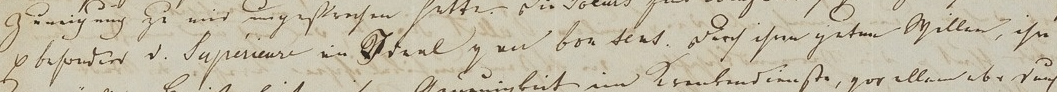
& besonders d.Supérieure ein Ideal von bon sens. Durch ihren guten Willen, ihre
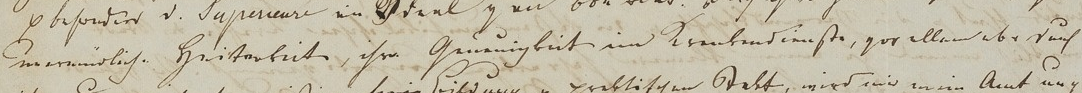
unermüdliche Heiterkeit, ihre Genauigkeit im Krankendienste, vor allem aber durch
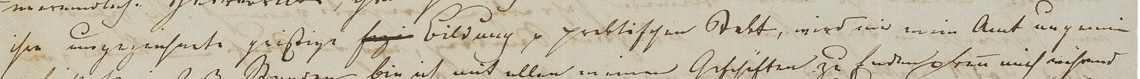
ihre ausgezeichnete geistige Erzie Bildung & praktischen Takt, wird mir mein Amt ungemein
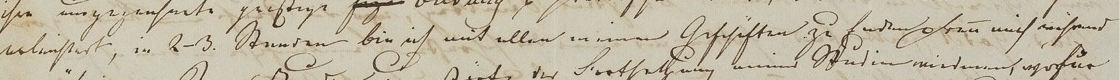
erleichtert, in 2–3. Stunden bin ich mit allen meinen Geschäften zu Enden & kann mich während
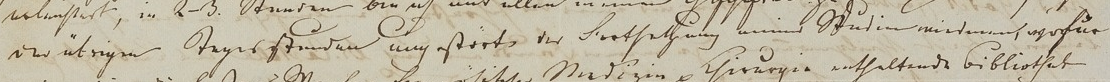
der übrigen Tagesstunden ungestört der Fortsetzung meiner Studien wiedmen, wofür
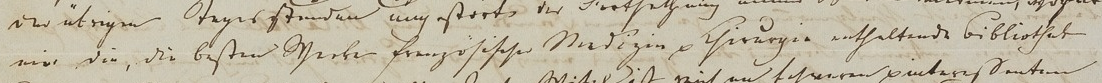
mir die, die besten Werke französischer Medizin & Chirurgie enthaltende Bibliothek
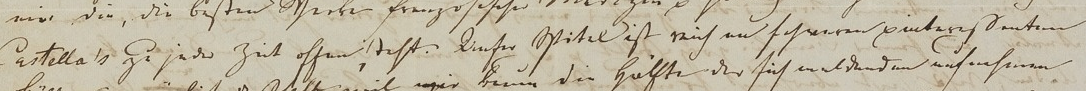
Castella's zu jeder Zeit offen steht. Unser Spital ist reich an schweren & interessanten
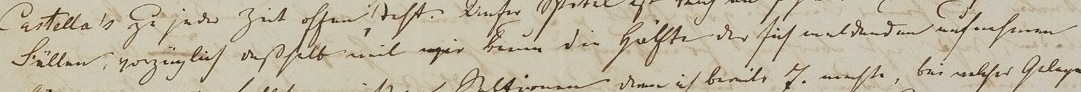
Fällen, vorzüglich desshalb weil wir kaum die Hälfte der sich meldenden aufnehmen
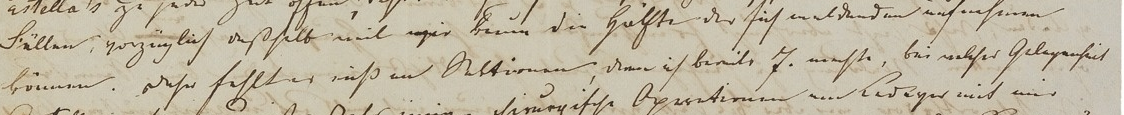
können. Daher fehlt es nicht an Sektionen, deren ich bereits 7. machte, bei welcher Gelegenheit
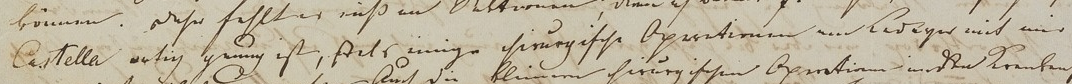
Castella artig genug ist, stets einige chirurgische Operationen am Cadaver mit mir
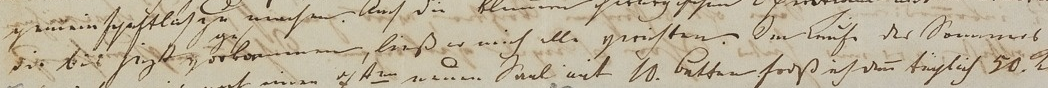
die bis jezt vorgekommen, ließ er mich alle verichten. Im Laufe des Sommers
